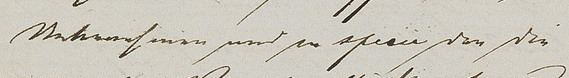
Unternehmen und in specie der die
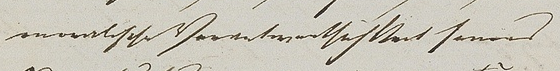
moralische Verantwortlichkeit seines
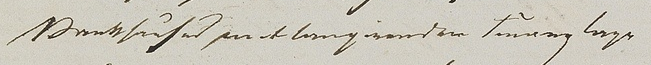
Bankhauses mit tangierenden Finanzlage
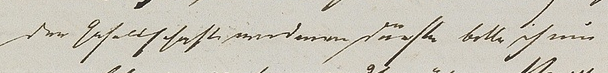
der Gesellschaft widmen dürfte bitte ich um
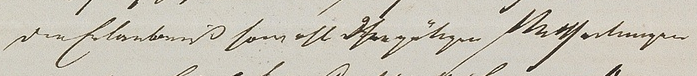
die Erlaubniß sowohl Ihre gütigen Mittheilungen
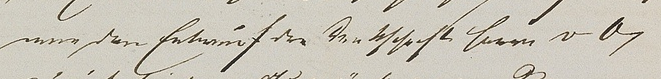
wie den Entwurf der Denkschrift Herrn v. O
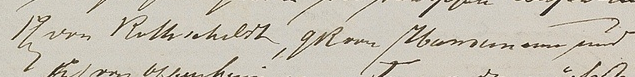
von Rothschildt, GR von Hansemann und
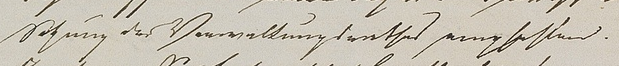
Sitzung des Verwaltungsrathes empfehlen.
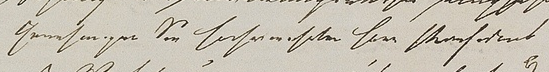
Genehmigen Sie hochverehrter Herr Praesident
